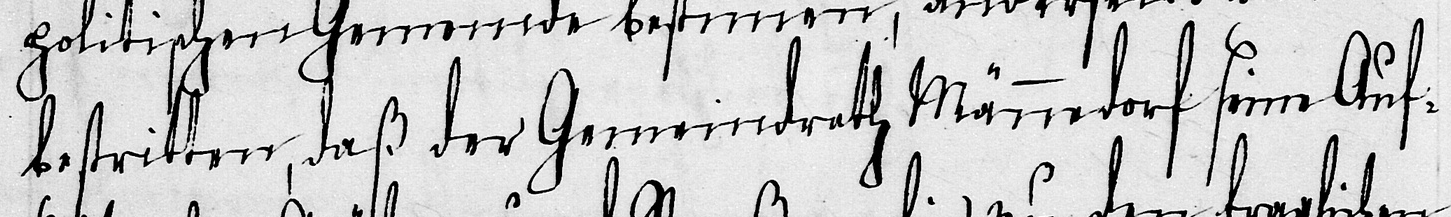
bestritten, daß der Gemeindrath Männedorf seine Auf¬
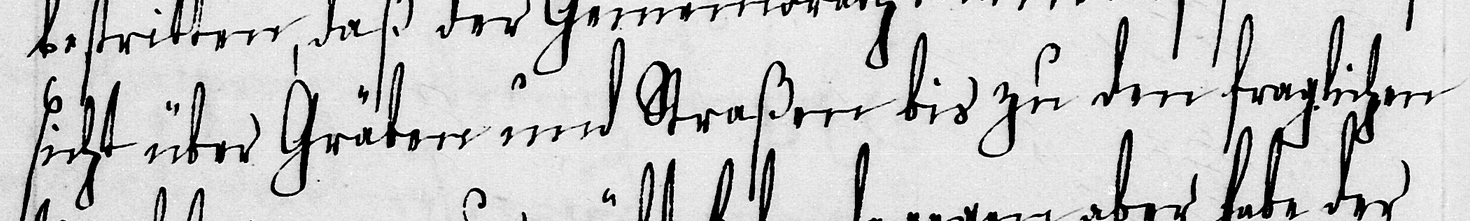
sicht über Gräben und Straßen bis zu den fraglichen
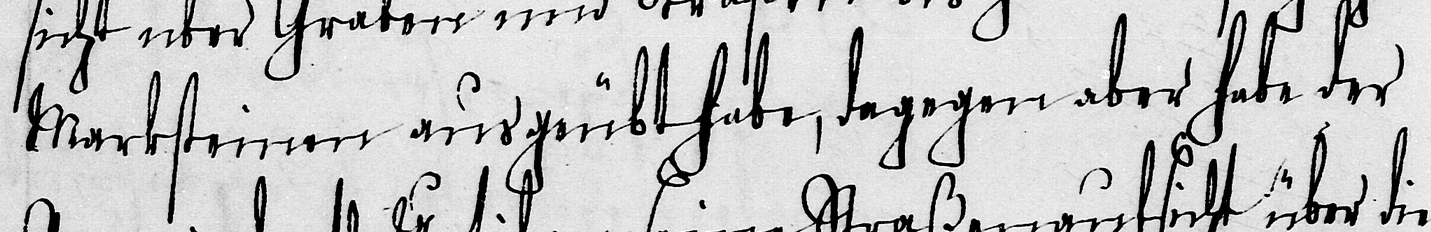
Marksteinen ausgeübt habe, dagegen aber habe der
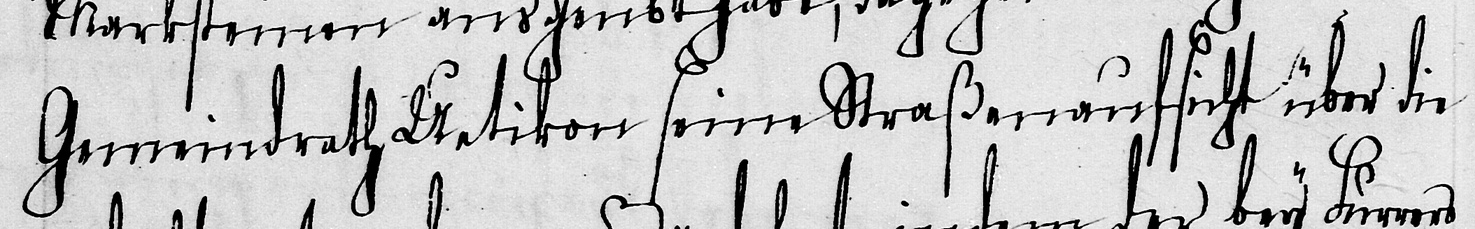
Gemeindrath Uetikon seine Straßenaufsicht über die
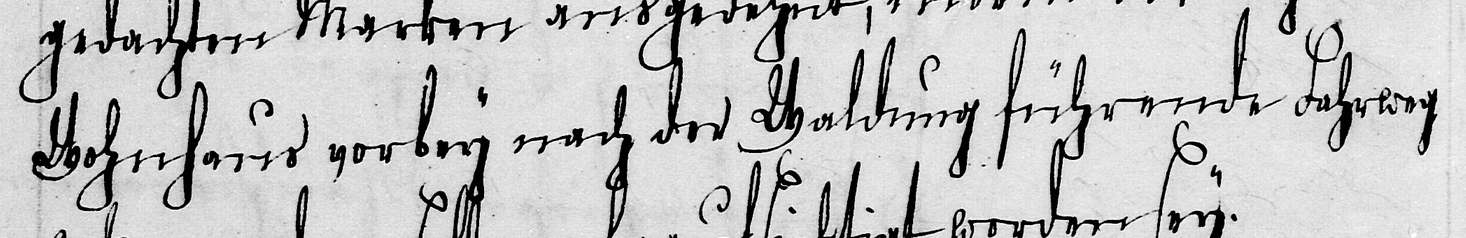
Wohnhaus vorbey nach der Waldung führende Fahrweg
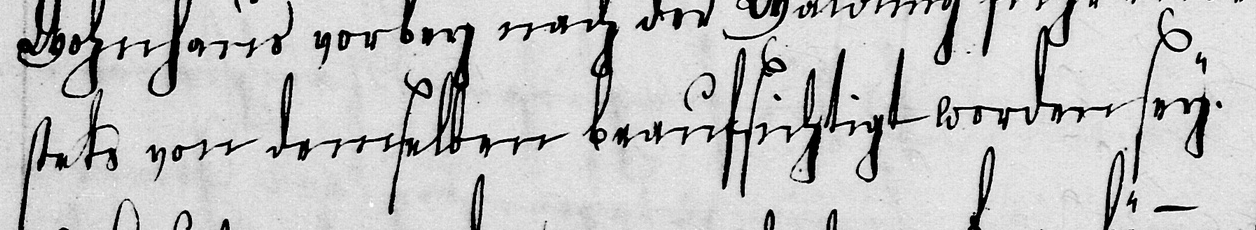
stets von demselben beaufsichtigt worden sey.
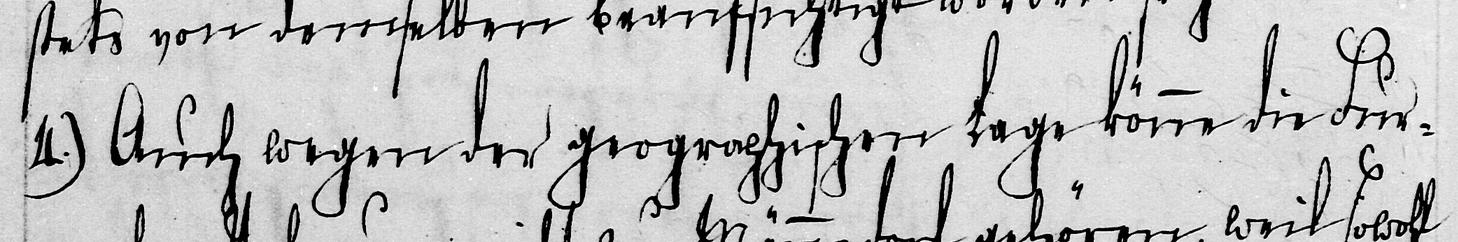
4.) Auch wegen der geographischen Lage könne die Fur¬
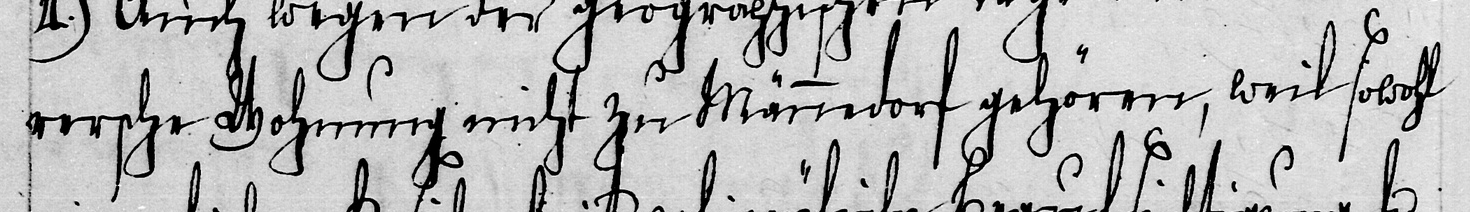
rersche Wohnung nicht zu Männedorf gehören, weil sowohl
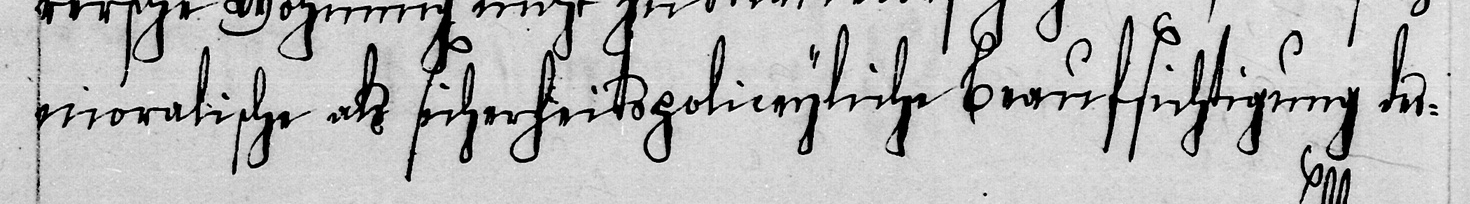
moralische als sicherheitspoliceyliche Beaufsichtigung des-
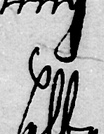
ers
